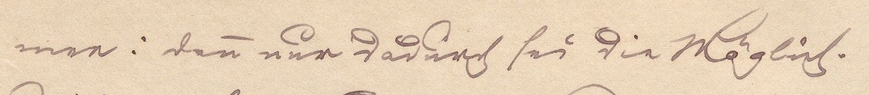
men: denn nur dadurch sei die Möglich-
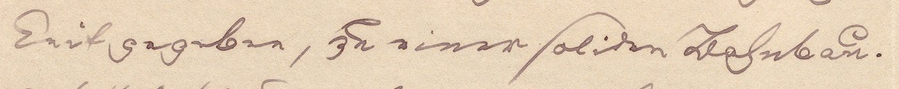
keit gegeben, zu einer soliden Bahnbau-
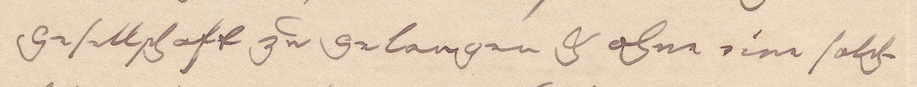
gesellschaft zu gelangen & ohne eine solche
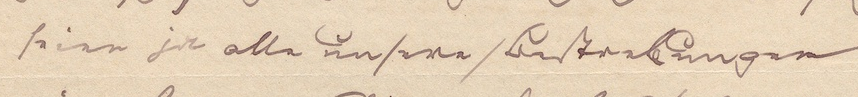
seien ja alle unsere Bestrebungen
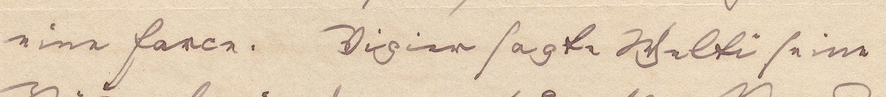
eine Farce. Vigier sagte Welti seine
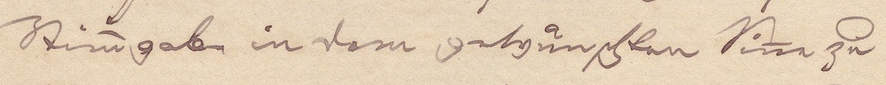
Stimmgabe in dem gewünschten Sinne zu
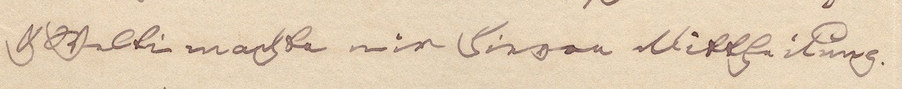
& Welti machte mir hievon Mittheilung.
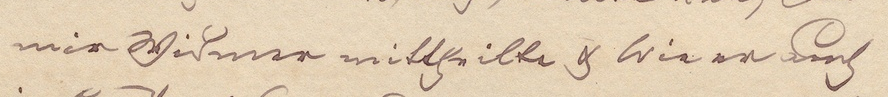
mir Widmer mittheilte & wie er auch
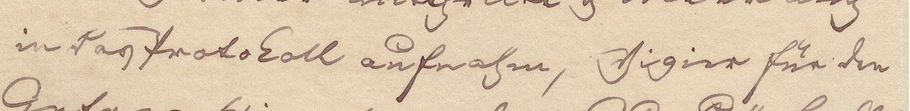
in das Protokoll aufnahm, Vigier für den
